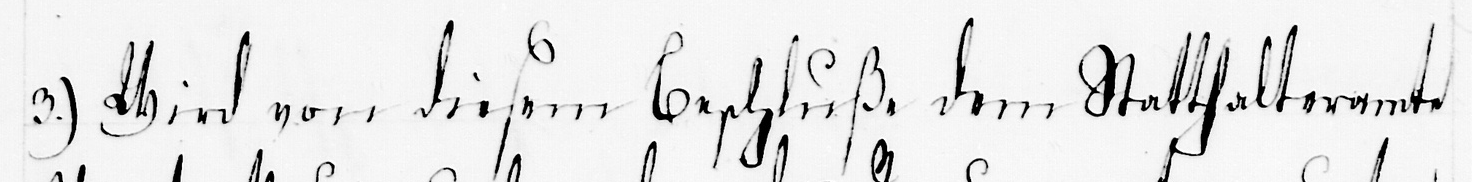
3.) Wird von diesem Beschluße dem Statthalteramte
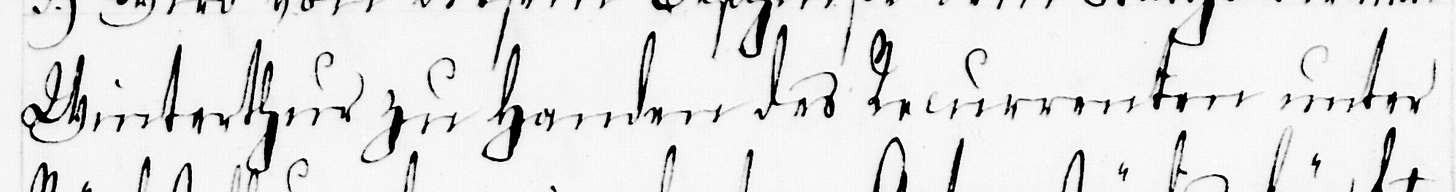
Winterthur zu Handen des Recurrenten unter
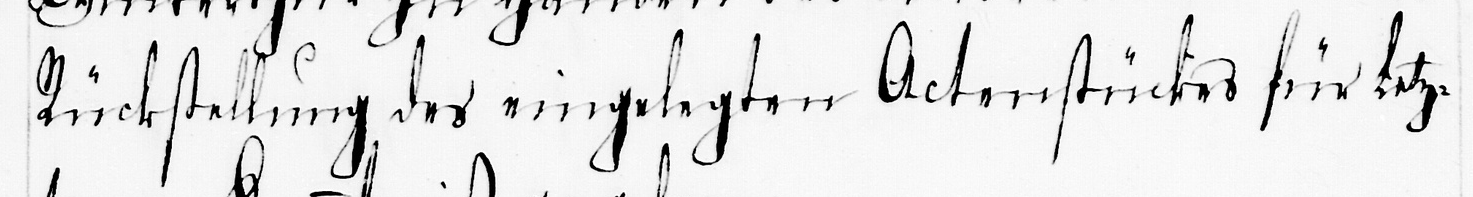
Rückstellung des eingelegten Actenstückes für Letz¬
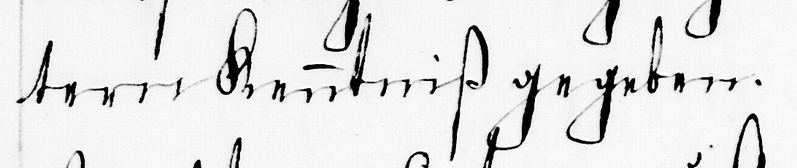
tern Kenntniß gegeben.
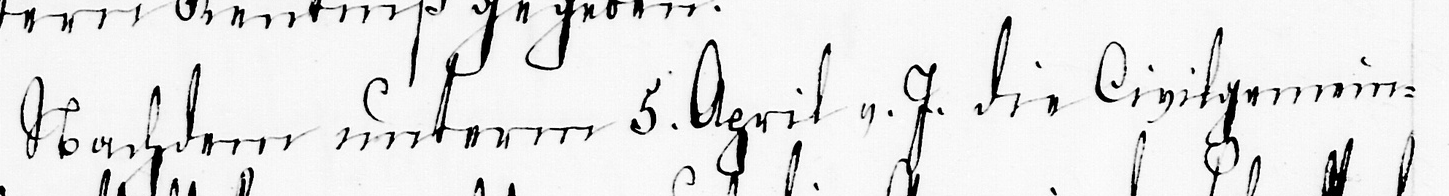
Nachdem unterm 5. April v. J. die Civilgemein¬
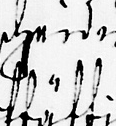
der
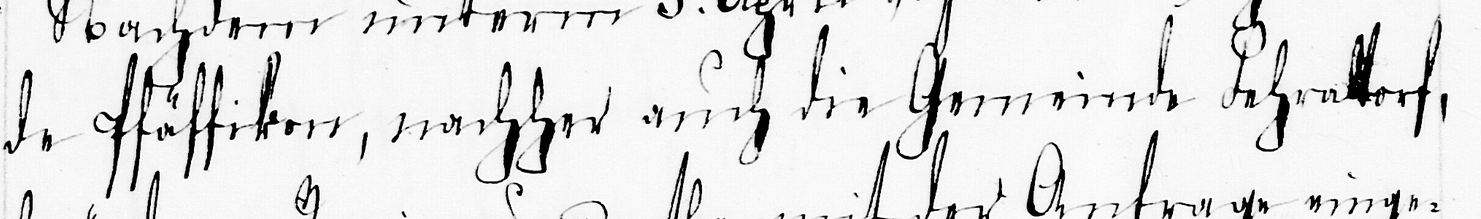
de Pfäffikon, nachher auch die Gemeinde Fehraltorf,
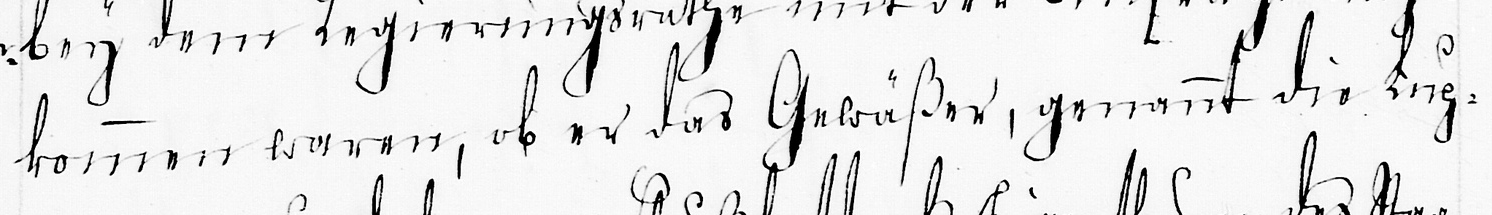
kommen waren, ob er das Gewäßer, genannt die Lup¬
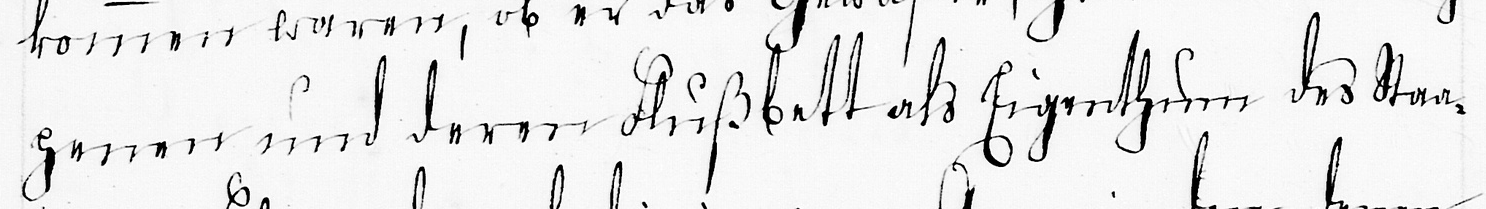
penen und deren Flußbett als Eigenthum des Staa¬
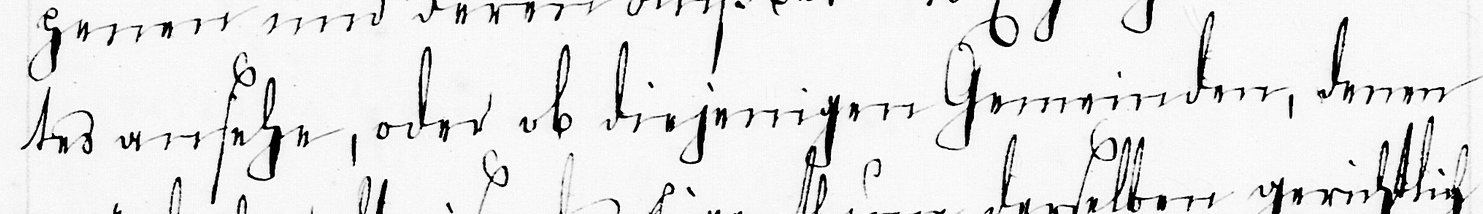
tes ansehe, oder ob diejenigen Gemeinden, denen
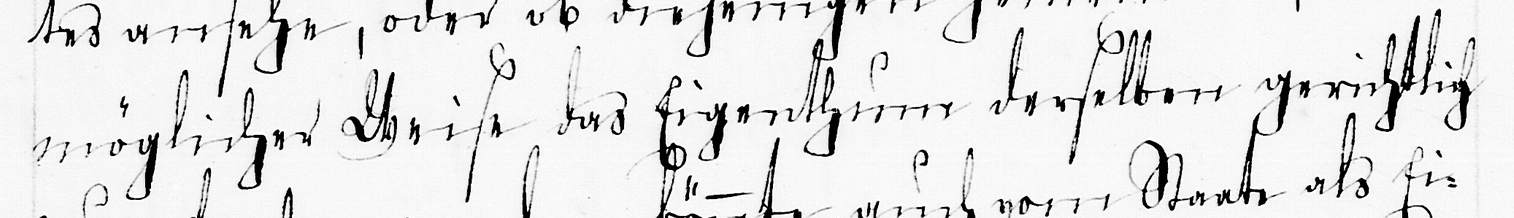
möglicher Weise das Eigenthum derselben gerichtlich
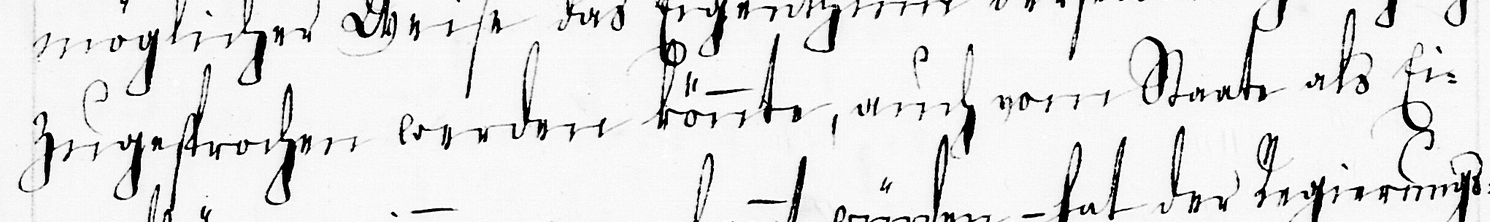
zugesprochen werden könnte, auch vom Staate als Ei¬
